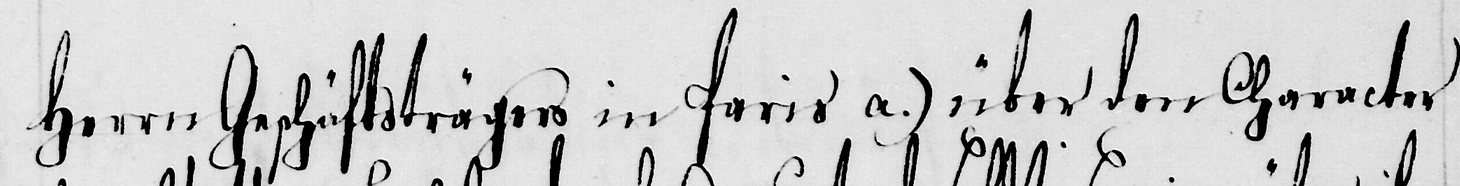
Herrn Geschäftsträgers in Paris a.) über den Character
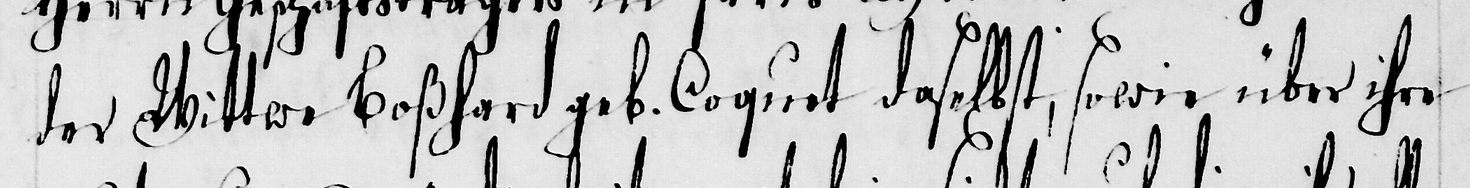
der Wittwe Boßhard geb. Coquet daselbst, sowie über ihre
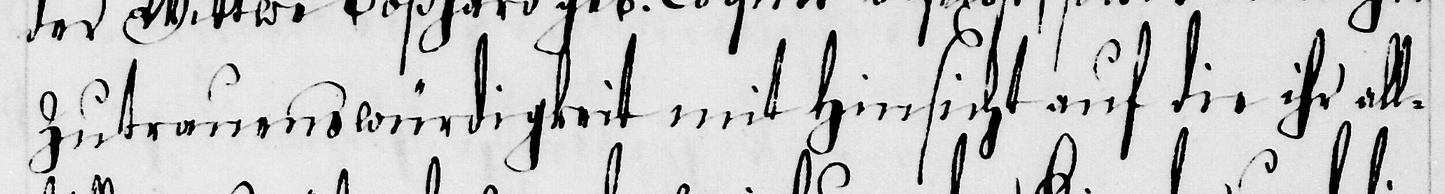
Zutrauenswürdigkeit mit Hinsicht auf die ihr al¬
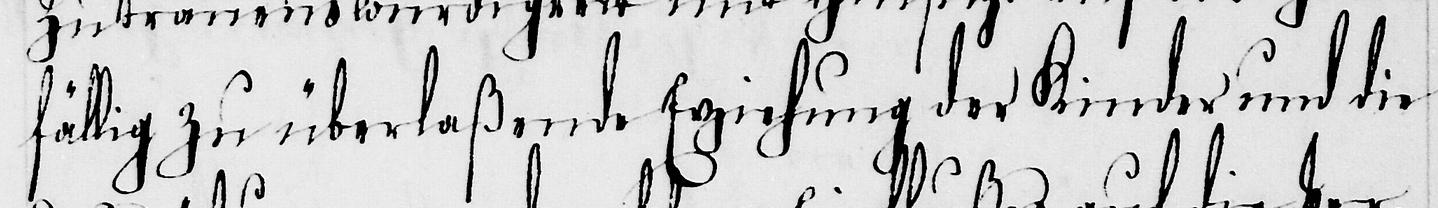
fällig zu überlaßende Erziehung der Kinder und die
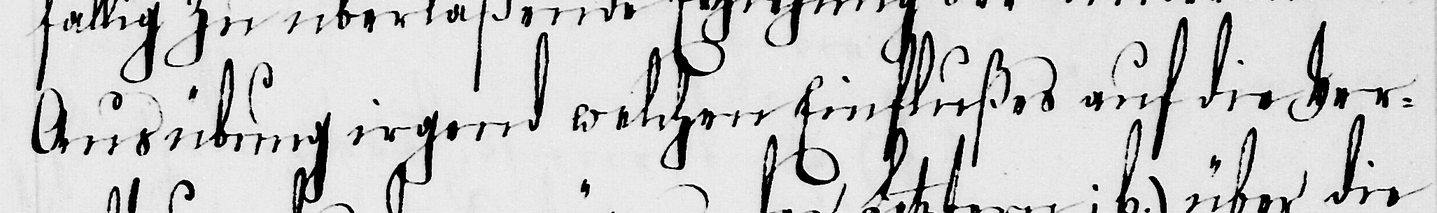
Ausübung irgend welchen Einflußes auf die Ver¬
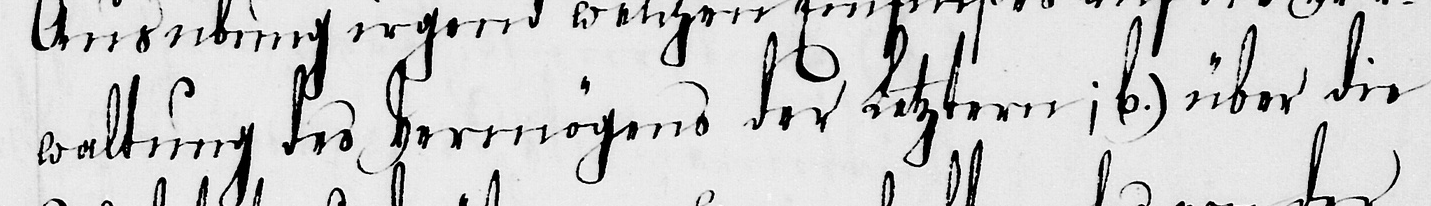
waltung des Vermögens der Letztern; b.) über die
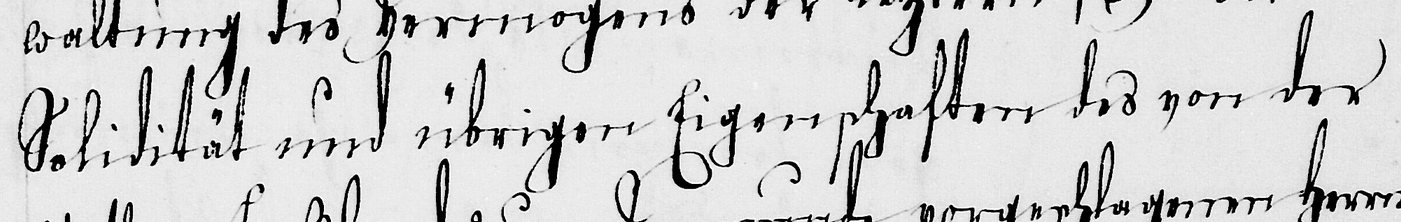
Solidität und übrigen Eigenschaften des von der
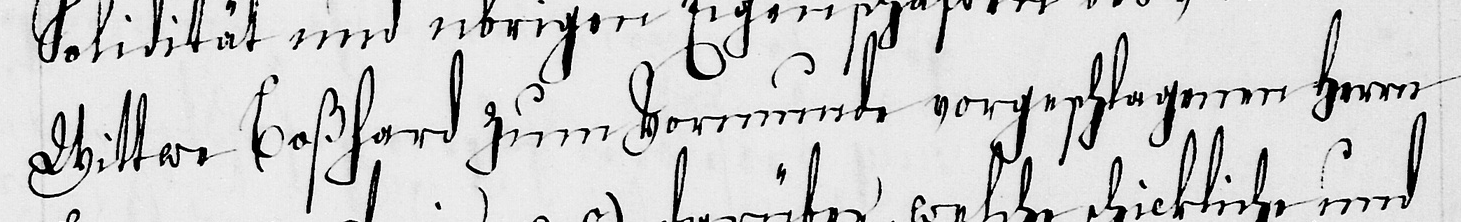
Wittwe Boßhard zum Vormunde vorgeschlagenen Herrn
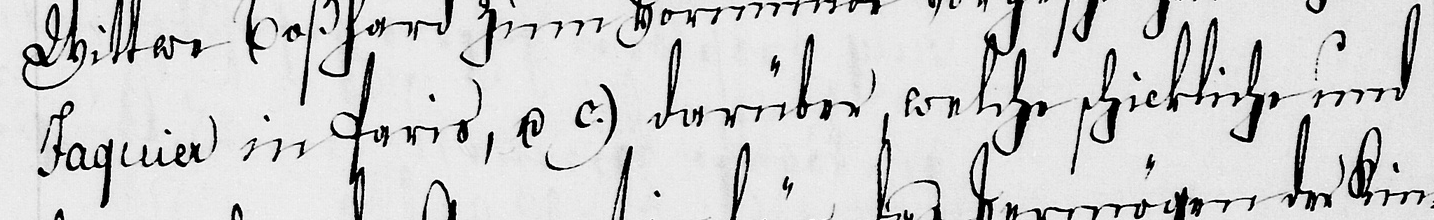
Jaquier in Paris, u. c.) darüber welche schickliche und
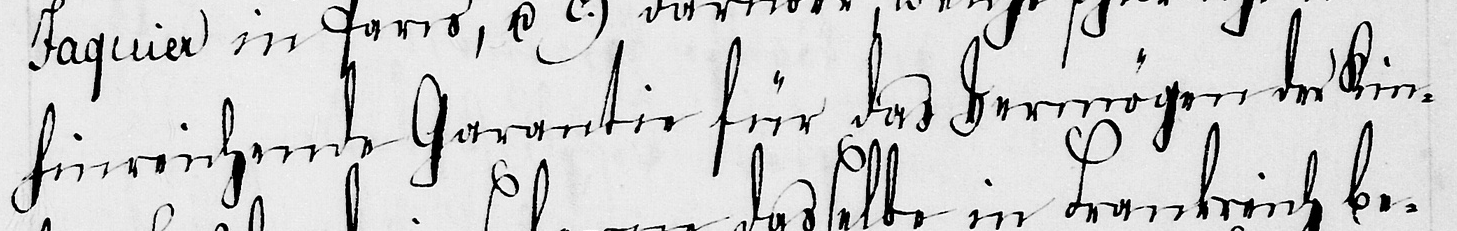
hinreichende Garantie für das Vermögen der Kin¬
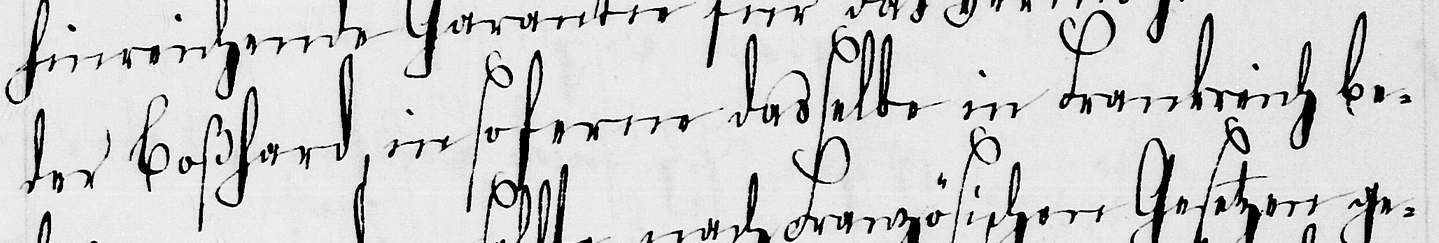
der Boßhard, insoferne dasselbe in Frankreich be¬
